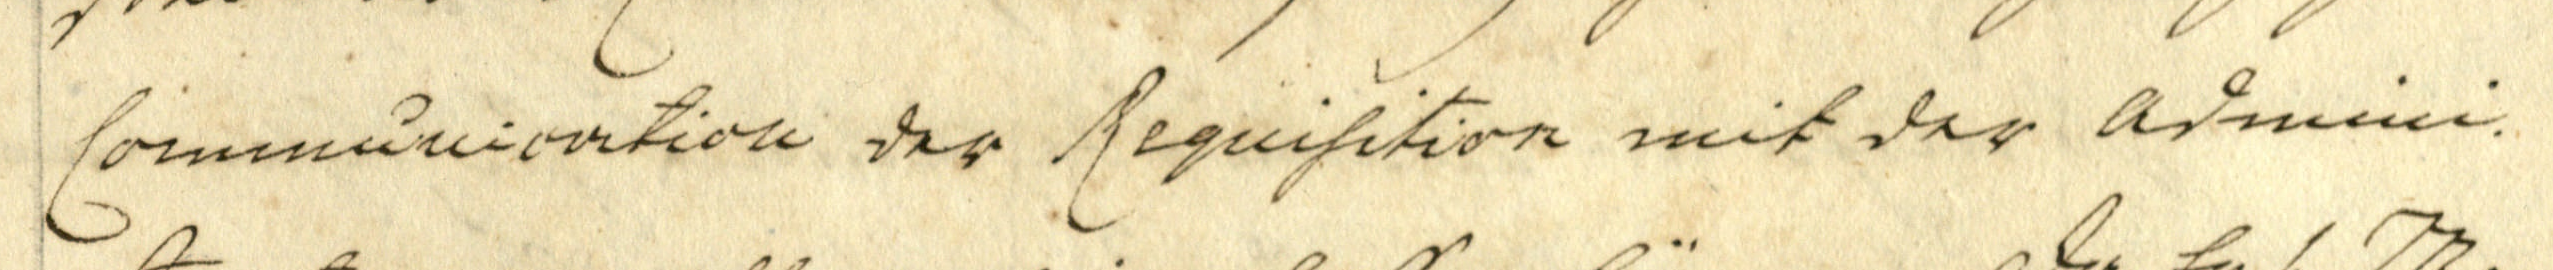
Communication der Requisition mit der Admini¬
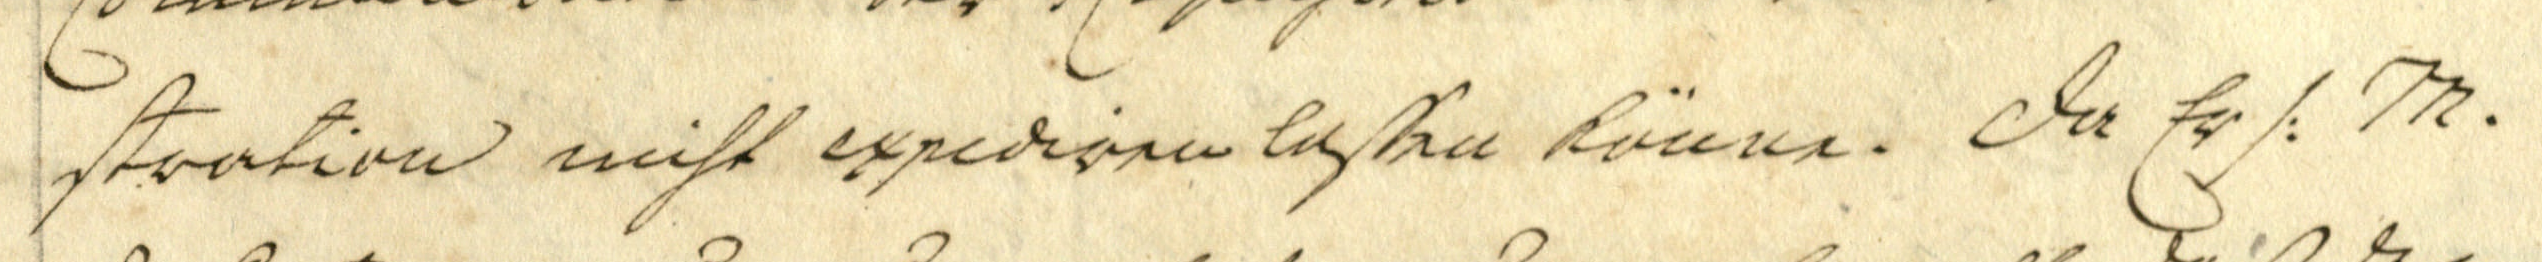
stration nicht expediren lassen könne. Da Er /:M.
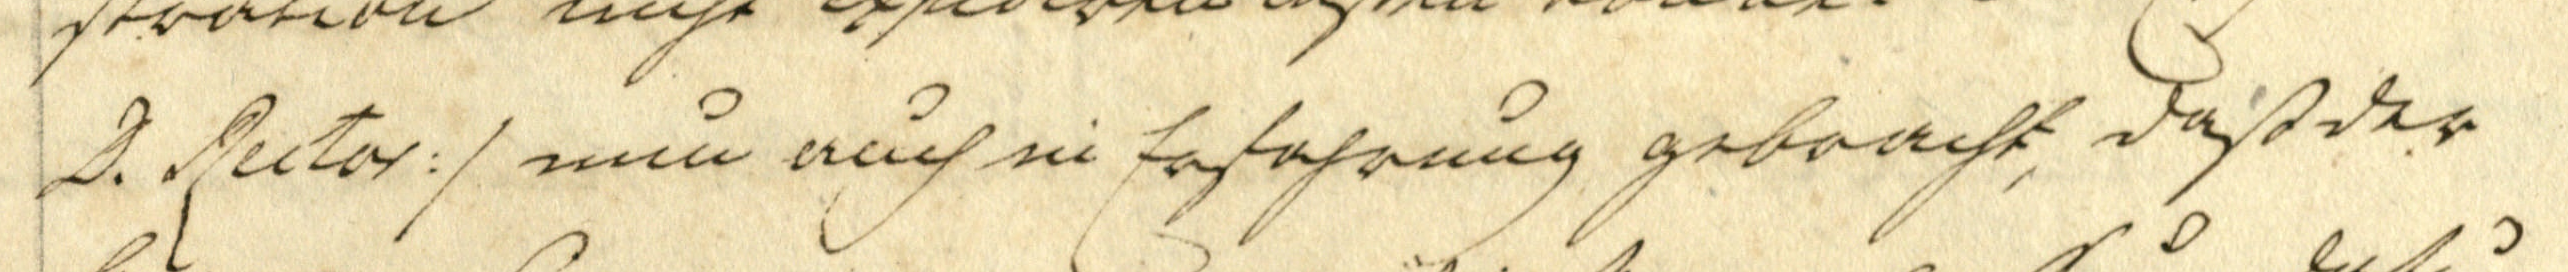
D. Rector :/ nun auch in Erfahrung gebracht, daß der
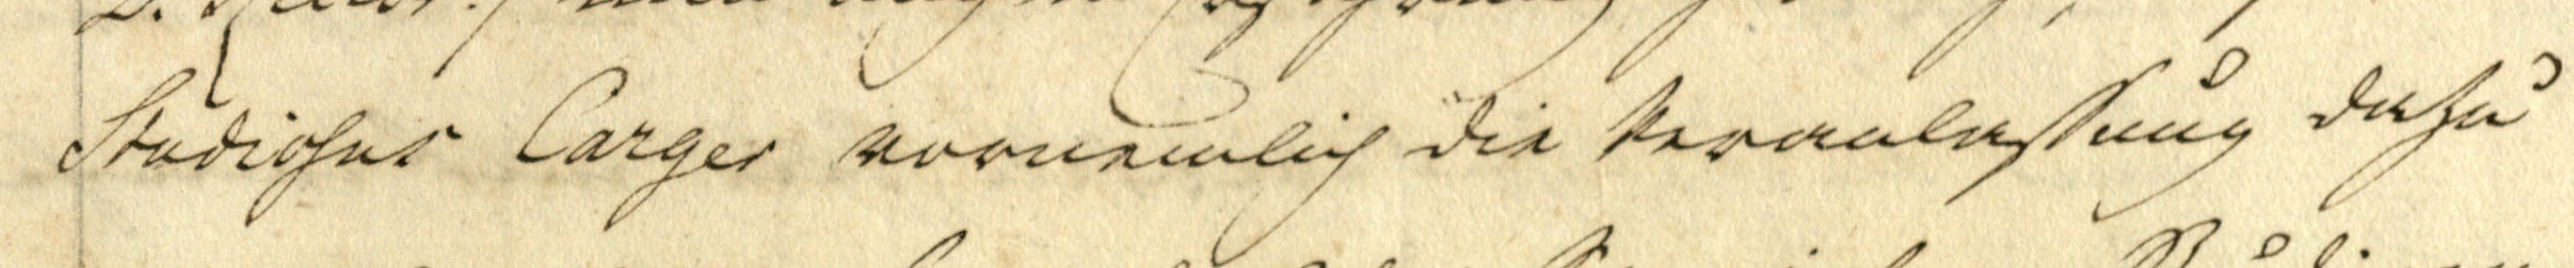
Studiosus Carger vornemlich die Veranlassung dazu
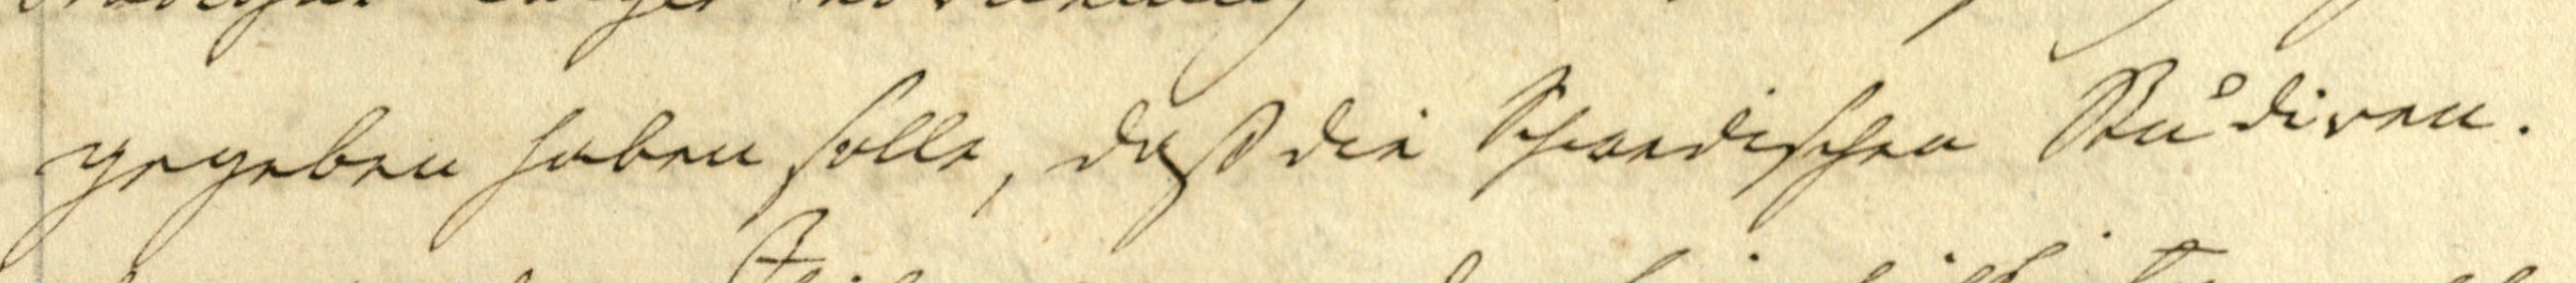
gegeben haben solle, daß die Schwedischen Studiren¬
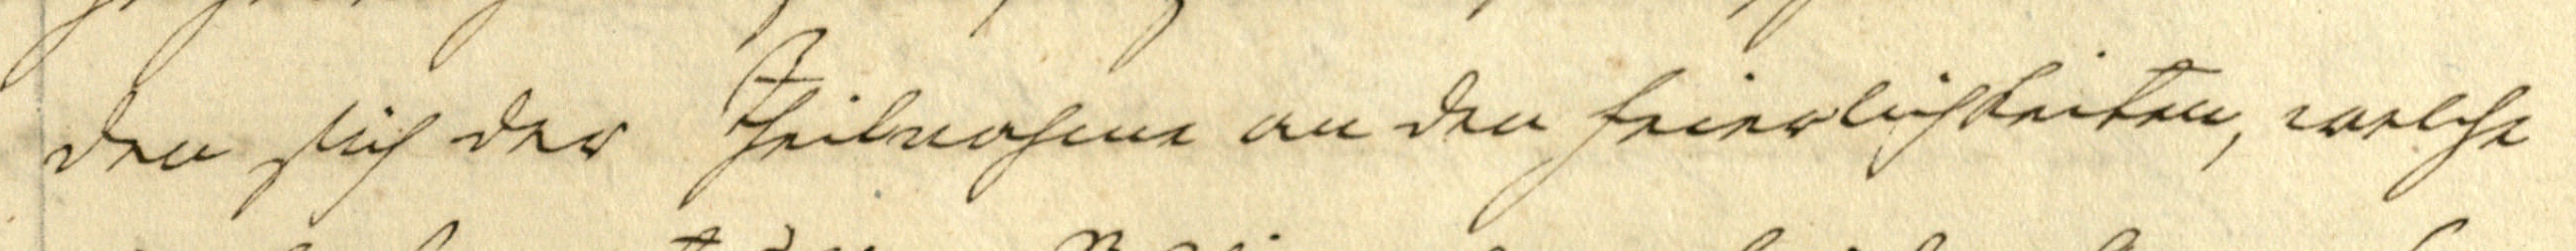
den sich der Theilnahme an den Feierlichkeiten, welche
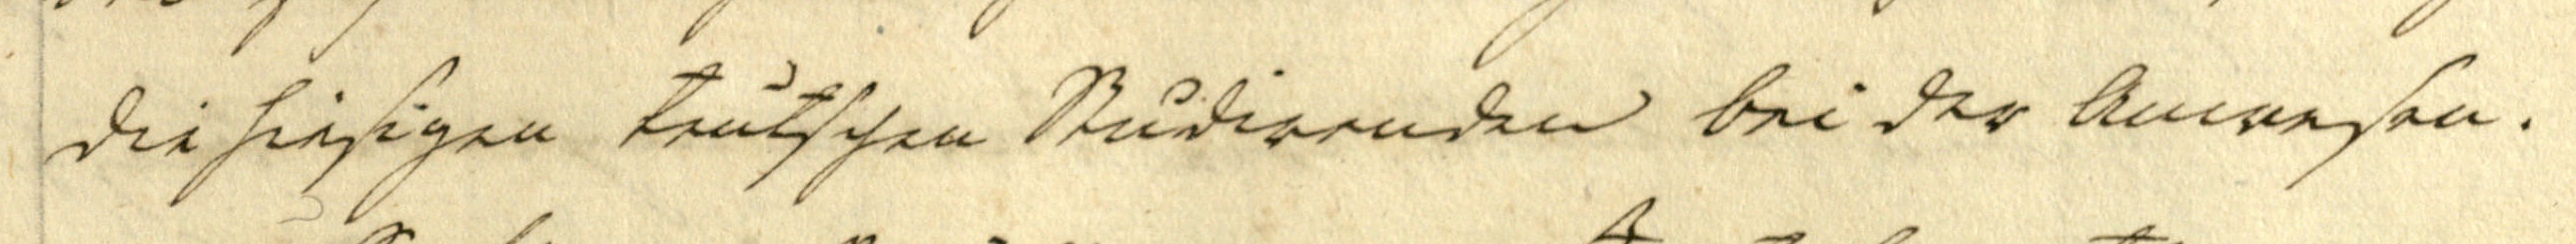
die hiesigen teutschen Studirenden bei der Anwesen¬
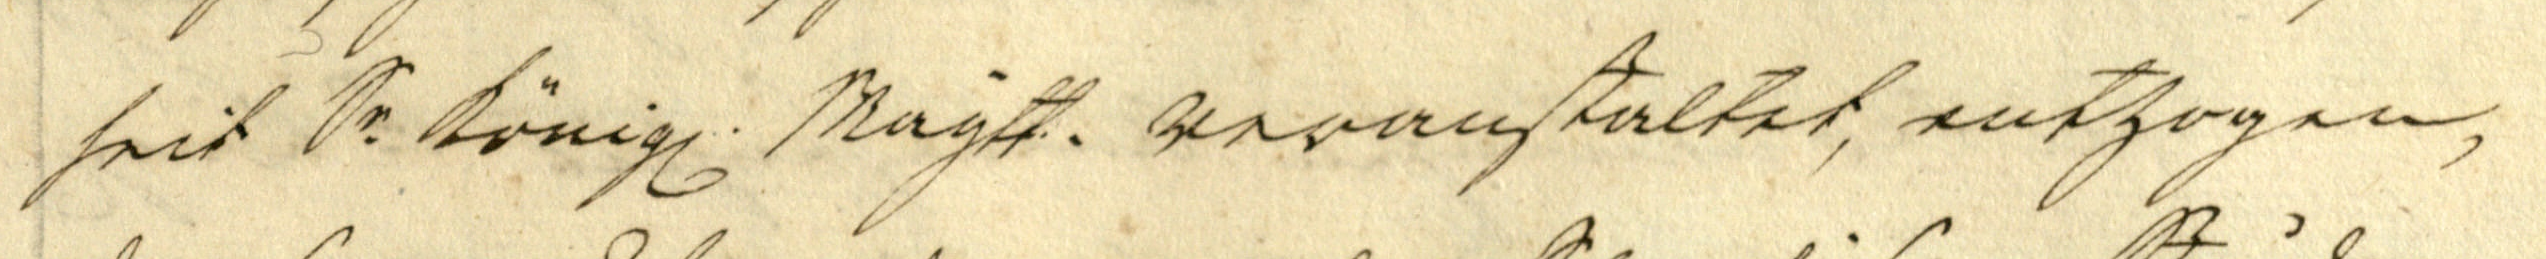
heit Sr Königl. Maÿtt. veranstaltet, entzogen,
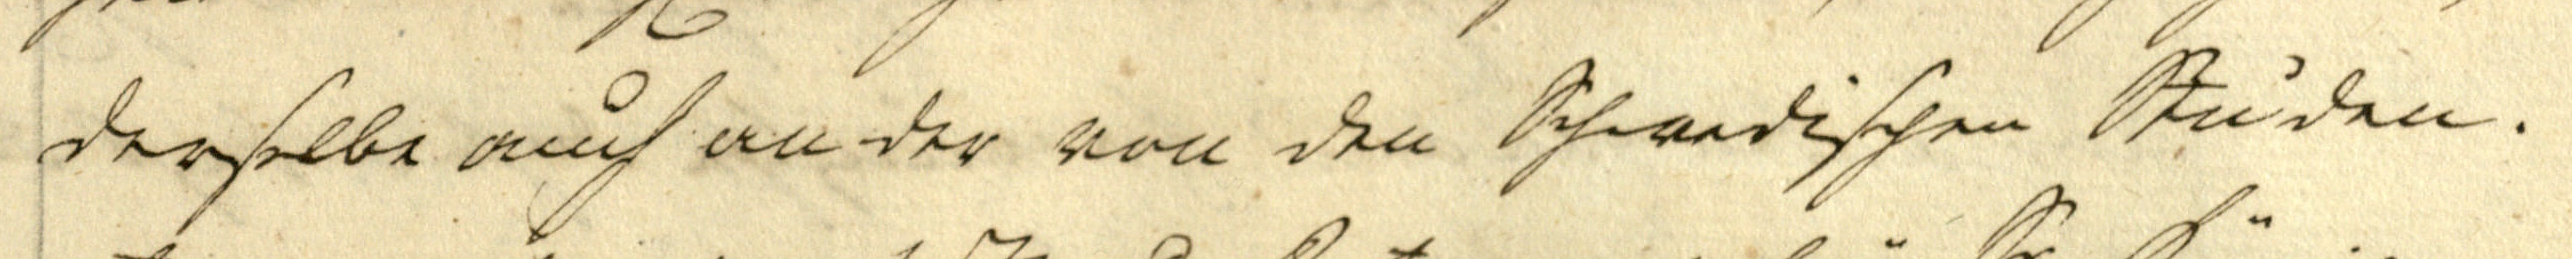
derselbe auch an der von den Schwedischen Studen¬
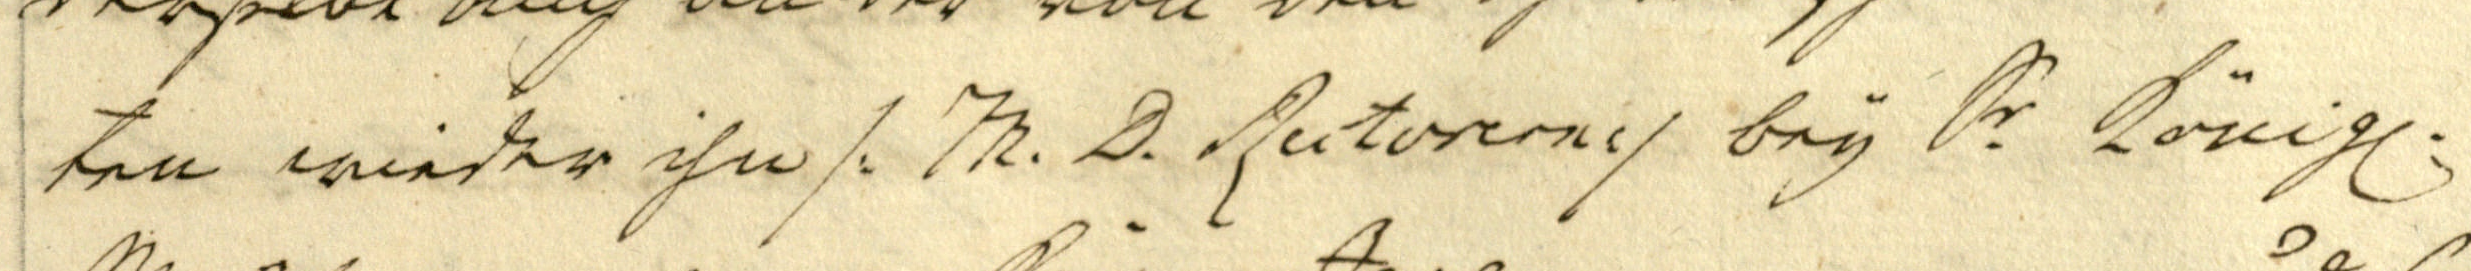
ten wieder ihn /: M. D. Rectorem ./ beÿ Sr Königl.
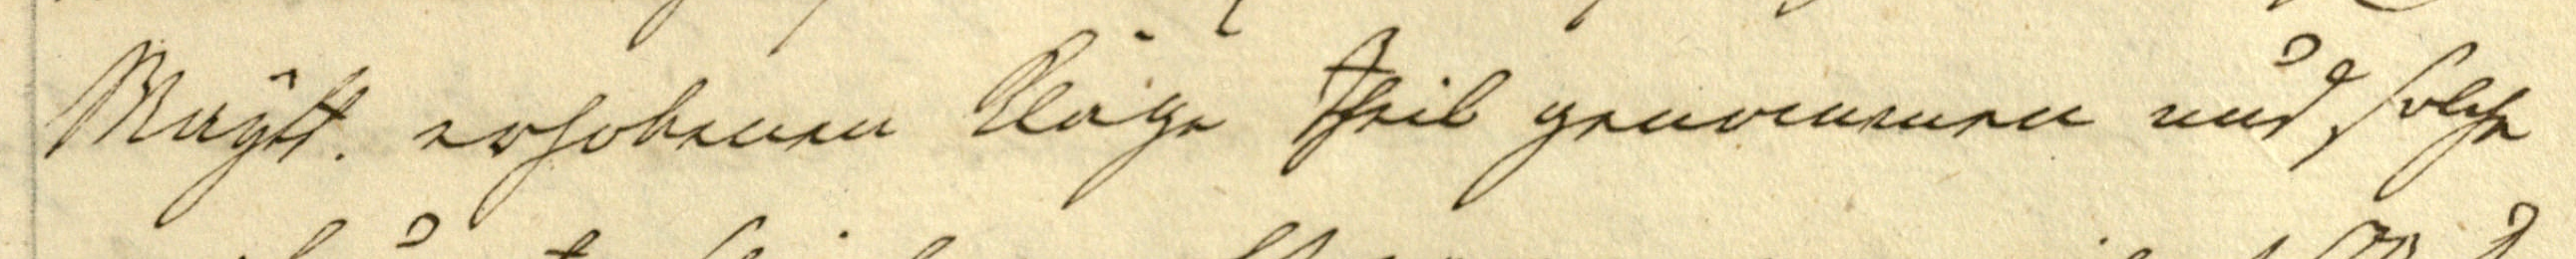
Maÿtt. erhobenen Klage Theil genommen und solche
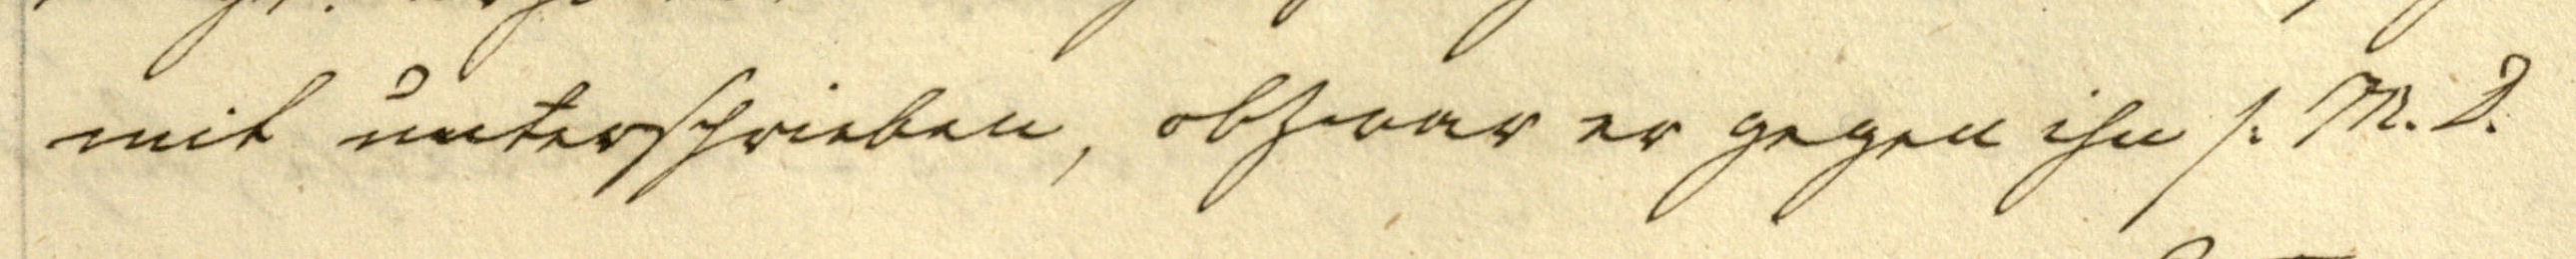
mit unterschrieben, obzwar er gegen ihn /. M. D.
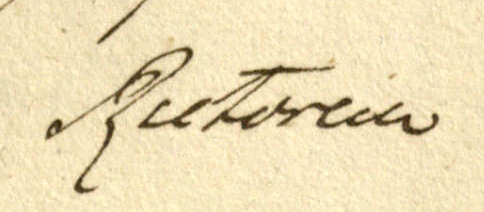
Rectorem
